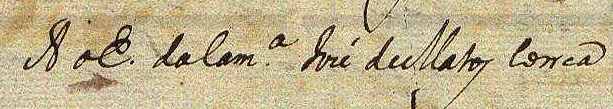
Not.o da Cam.a Iozé de Matos Correa
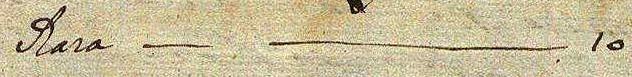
Raza -10
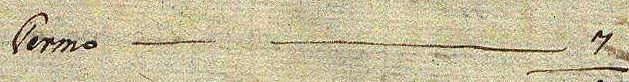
Termo -7
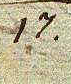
17.
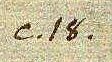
c.18.
